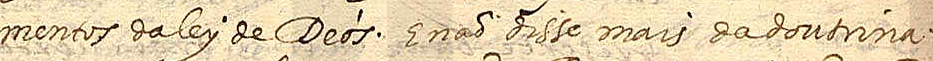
mentos da ley de Deōs. E naõ disse mais da doutrina.
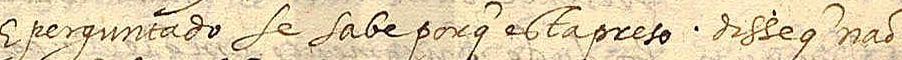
E perguntado se sabe por q̄ esta preso. disse q̄ naõ
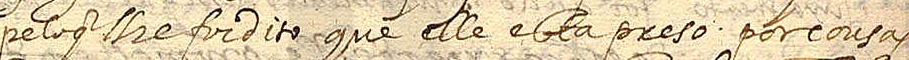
pelo q̄ lhe foi dito que elle esta preso por cousas
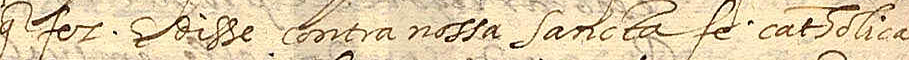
q̄ fez. E disse contra nossa Sancta fe catholica
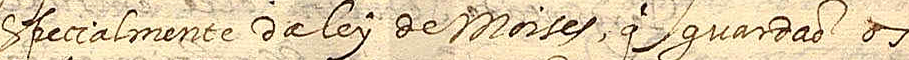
specialmente da ley de Moises, q̄ guardaõ os
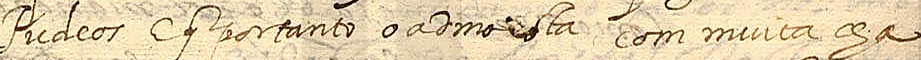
Iudeus E q̄ portanto o admoesta com muita cha
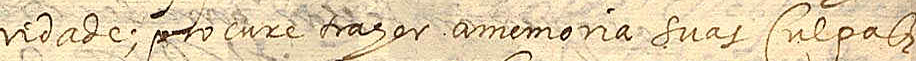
ridade; procure trazer a memoria suas Culpas
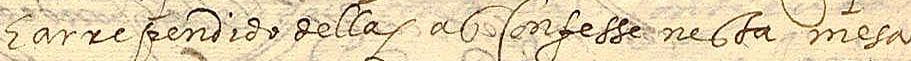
E arrependido dellas as Confesse nesta mesa
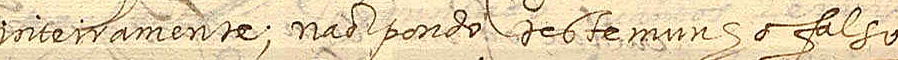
inteiramente; naõ pondo testemunho falso
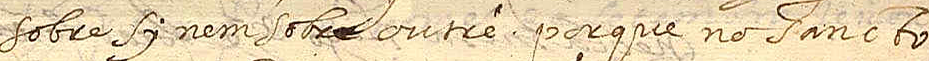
sobre sy nem sobre outrē porque no sancto
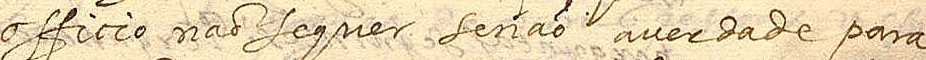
officio naõ se quer senaõ a uerdade para
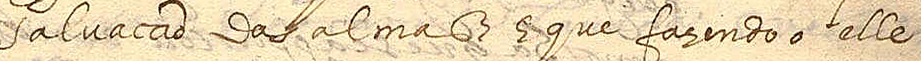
saluacaõ das almas E que fazendo o elle
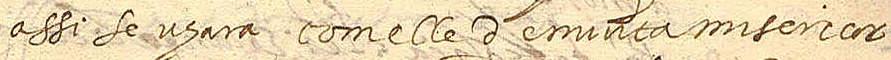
assi se usara com elle de muita misericor
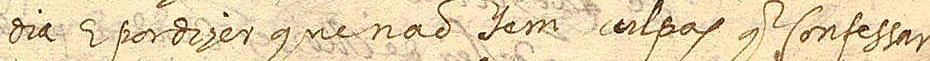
dia E por dizer que naõ tem culpas q̄ Confessar
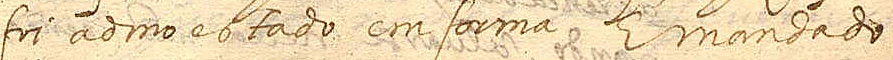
foi admoestado em forma E mandado
